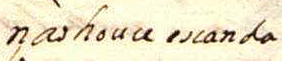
naõ houue escanda
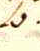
lo.
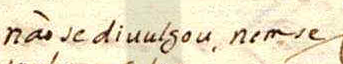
não se diuulgou, nem se
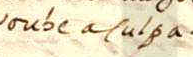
soube a Culpa.
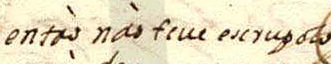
então não teue escrupolo
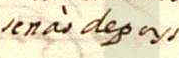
senão depoys.
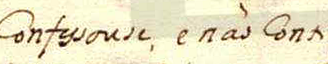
Confessouse, e não Conti
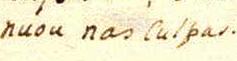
nuou nas culpas.
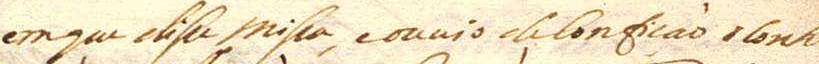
em que disse missa, e ouuio de Confiçaõ o conhe
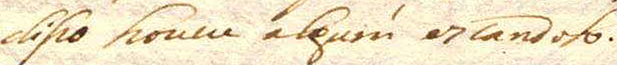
disso houue algum escandalo.
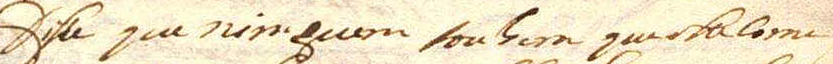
Disse que nimguem soubera que elle come
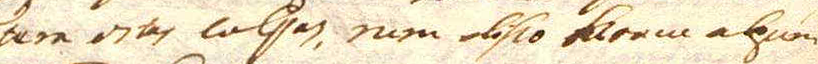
tera estas culpas, nem disso houue algum
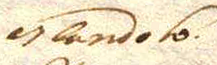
escandolo.
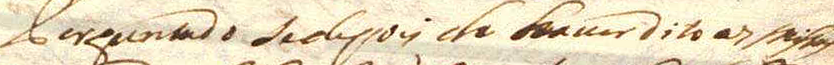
Perguntado se depois de hauer dito as missas
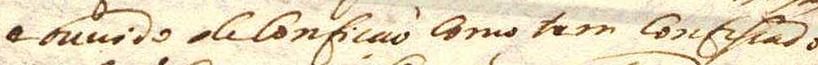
e ouuido de Confiçaõ como tem confessado
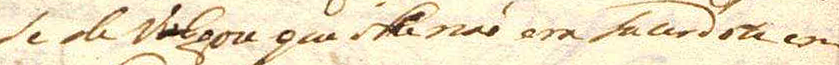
se devulgou que elle naõ era sacerdote em
